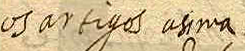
os artigos asima
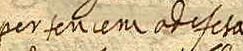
pertencem a defesa
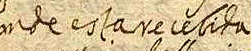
onde esta recebida
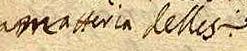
a matteria delles
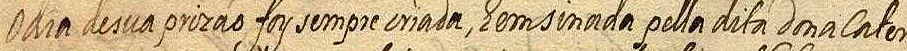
o dia de sua prizão foy sempre criada, E emsinada pella dita dona Cateri
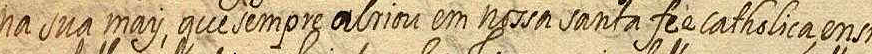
na sua may, que sempre a Criou em nossa santa feè catholica, ensi
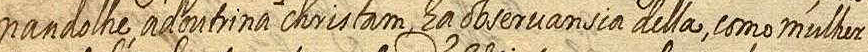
nandolhe a doutrina christam, E a obseruansia della, como mulher
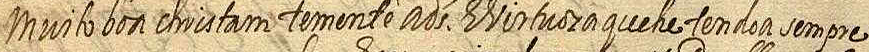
muito boa christam temente a ds̄ E Virtuoza que he tendoa sempre
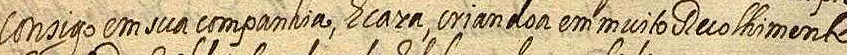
consigo em sua companhia, E caza, criandoa em muito Recolhimento
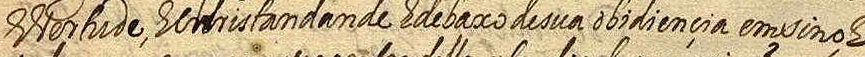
E Vertude, E Christandande E debaxo de sua obidiencia emsino, E
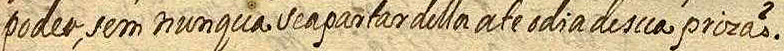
poder, sem nunqua se apartar della ate o dia de sua prizaõ.
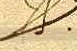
Pa
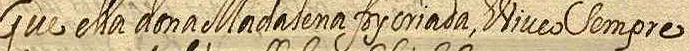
Que ella dona Madalena foy criada, E Viueo Sempre
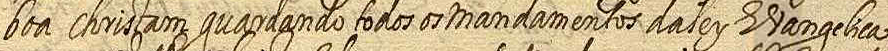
boa christam guardando todos os mandamentos da ley EVangelica
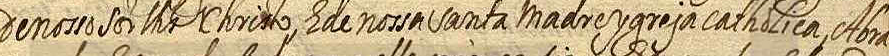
de nosso sor̄ Ihu Christo, E de nossa santa madre ygreja catholica, Abra
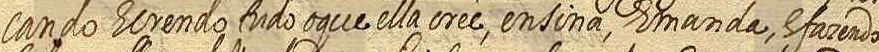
çando E crendo tudo o que ella cree, ensina, E manda, E fazendo
